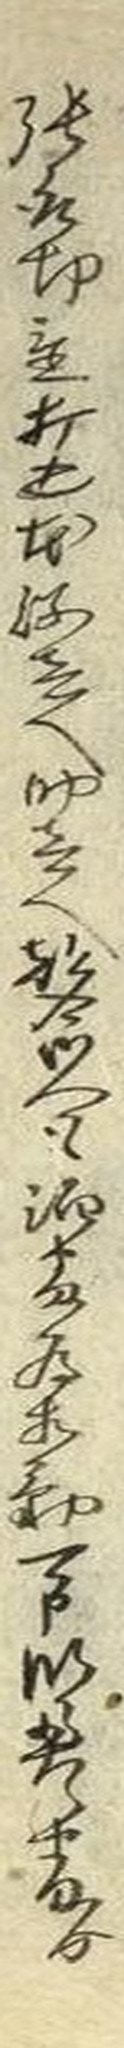張取切置打込本役壱人助壱人都合弐人ツヽ泊番為相勤可申段奥之番ゟ
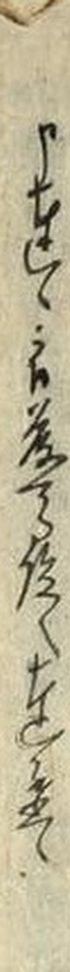申達候ニ付藤馬殿へ達置候
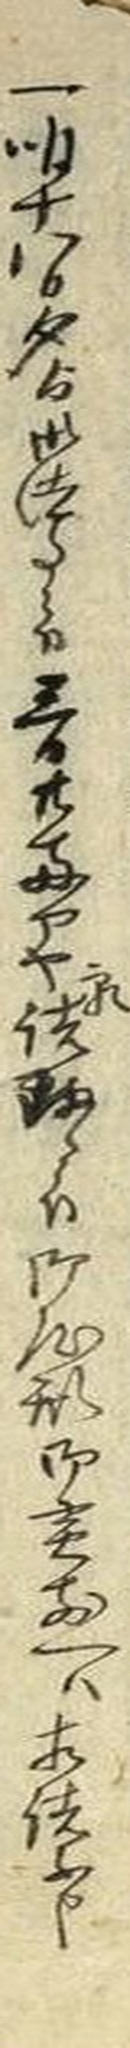一明十八日夕ゟ御法事ニ付三日共両部や願詰致候ニ付御屋形御霊前へハ相詰不申
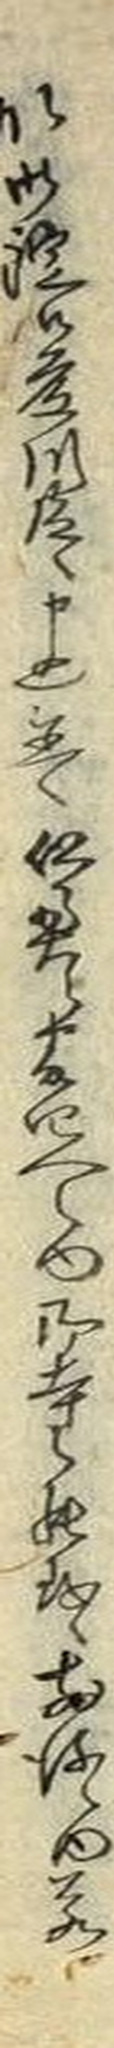段御錠口藤川殿へ申込置候但奥之番四人之内御寺へ罷越候前後之内若

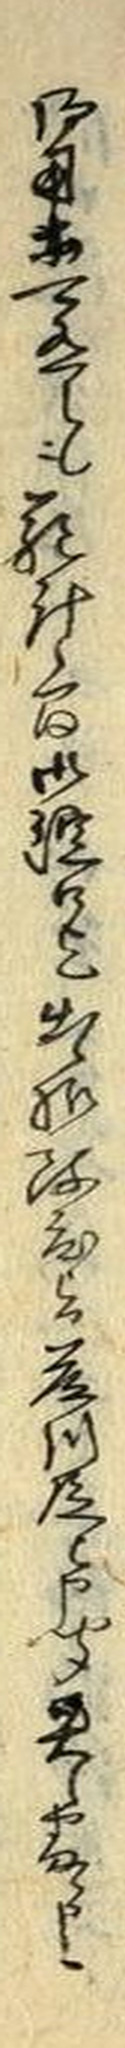御用等可有之も難計候間御錠口迄出候様致度旨藤川殿被申聞奥之番へ申
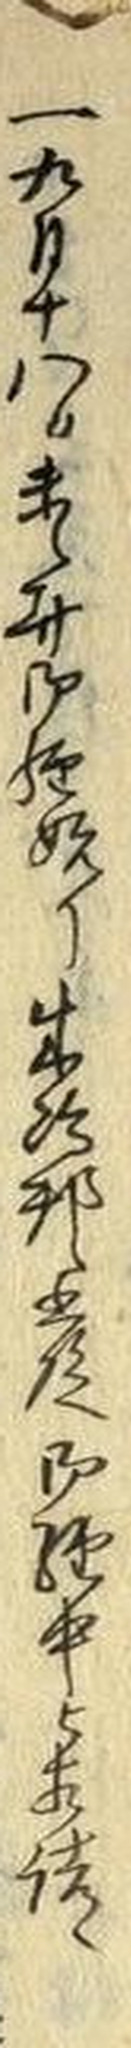一九月十八日未之刻御経始り成島邦之丞殿御経中被相詰候
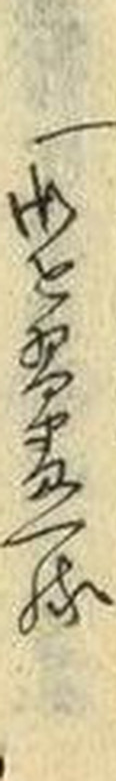御近習番不残
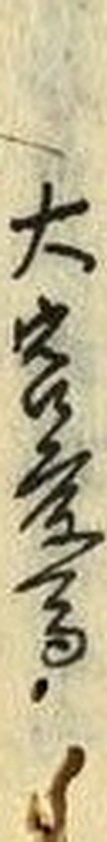大宮藤馬
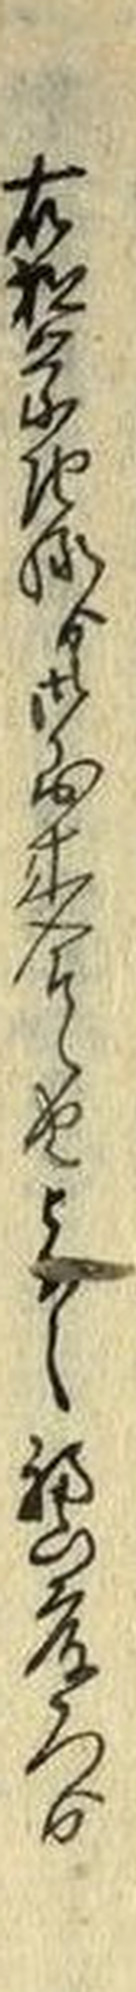右松栄院様ゟ御到来合之由被下之福山藤右衛門ゟ
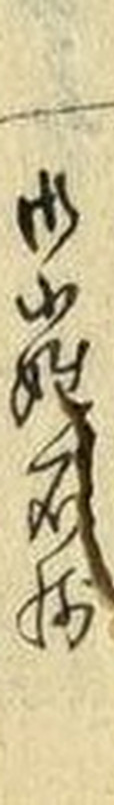御小姓不残
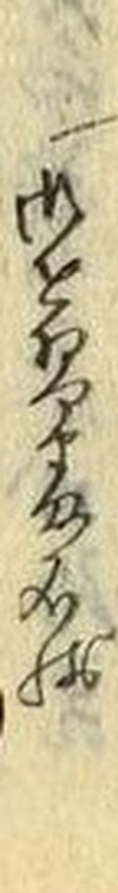御近習番不残
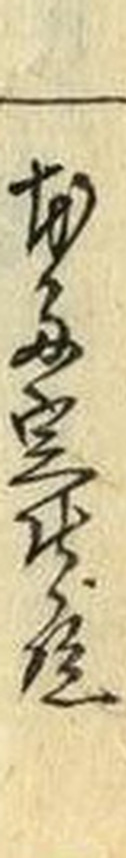本多定次郎殿
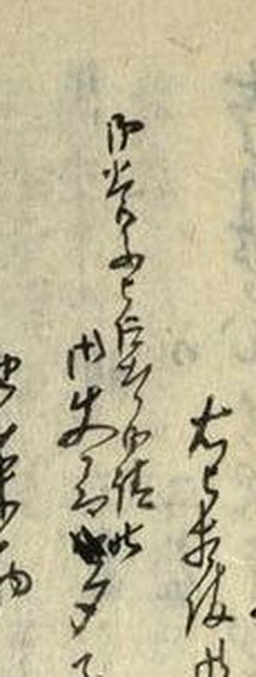御養子被仰出候御請
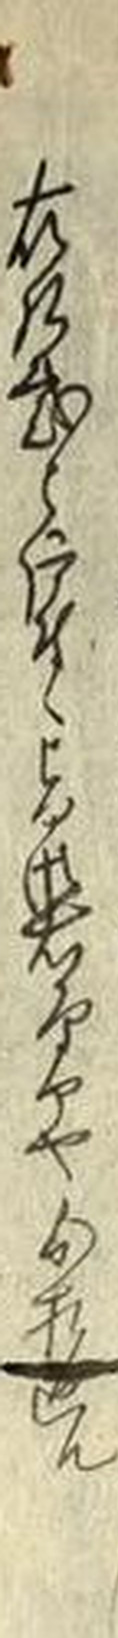右頂戴被仰付候旨御右筆部やゟ相廻ル
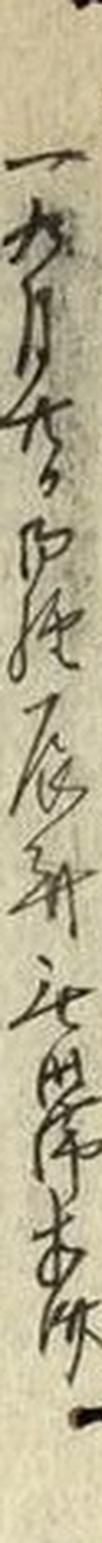一九月廿日御経辰刻無滞相済
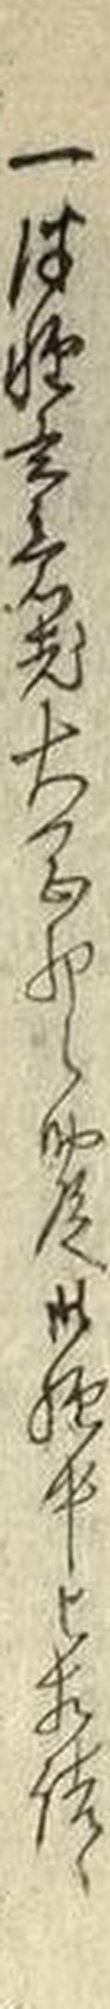一津軽玄意老大岡卯之助殿御経中被相詰候
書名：少傅日録抄（斉善付側向頭取日記、江戸并道中、初入在国、逝去後…
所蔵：福井県文書館 Fukui Prefectural Archives
